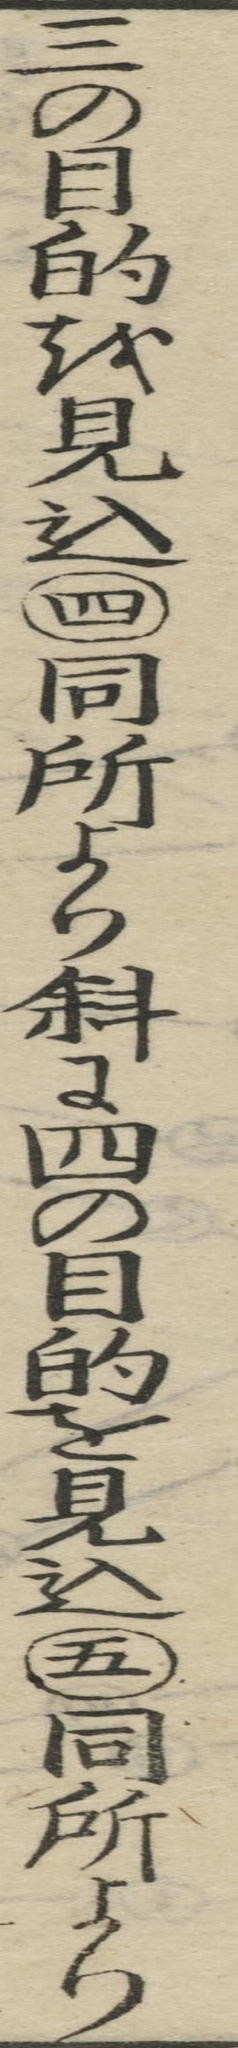三の目的を見込㊃同所より斜に四の目的を見込㊄同所より
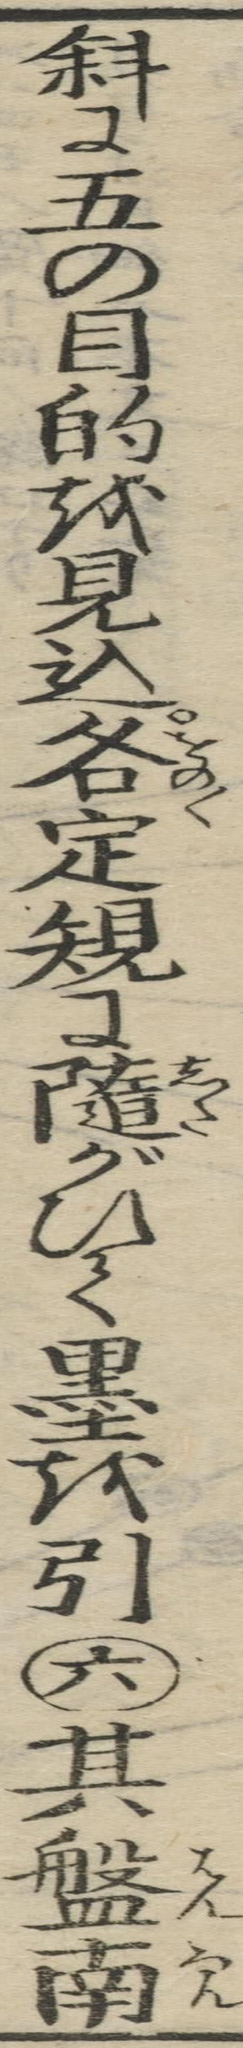斜に五の目的を見込。各定規に随がひて墨を引㊅其盤南
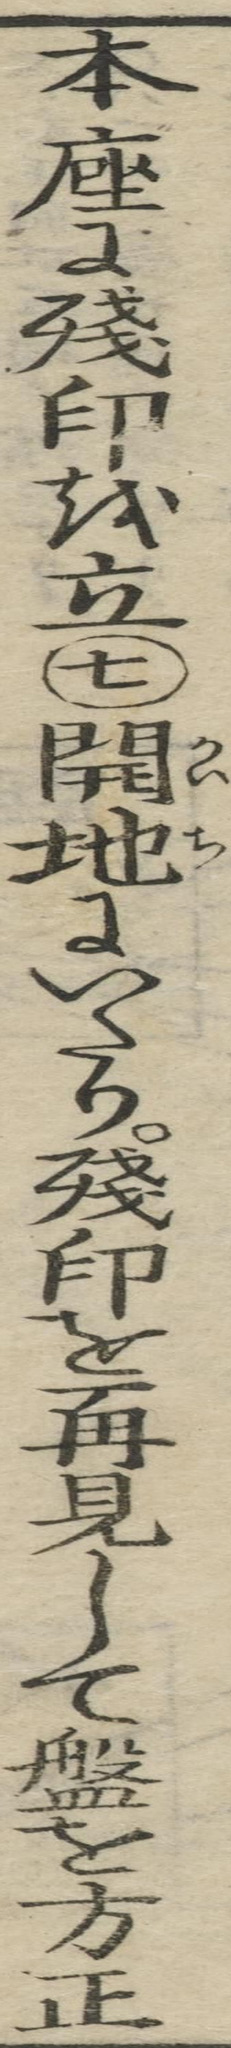本座に残印を立㊆開地にいたり。残印を再見して盤を方正
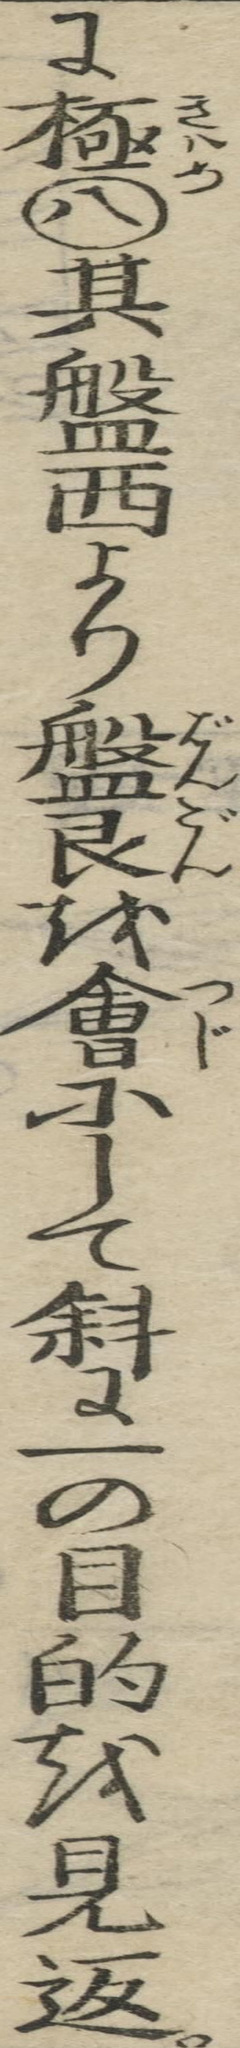に極㊇其盤西より盤艮を会にして斜に一の目的を見返。
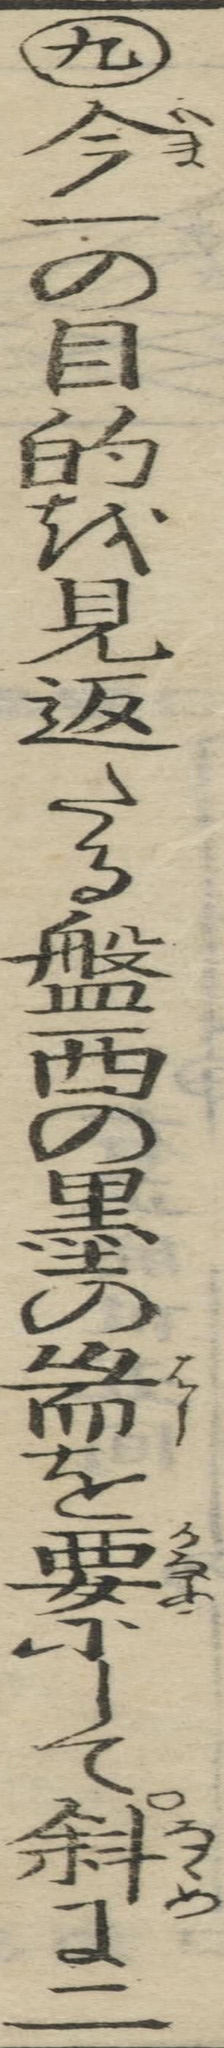㊈今一の目的を見返たる盤西の墨の耑を要にして。斜に二
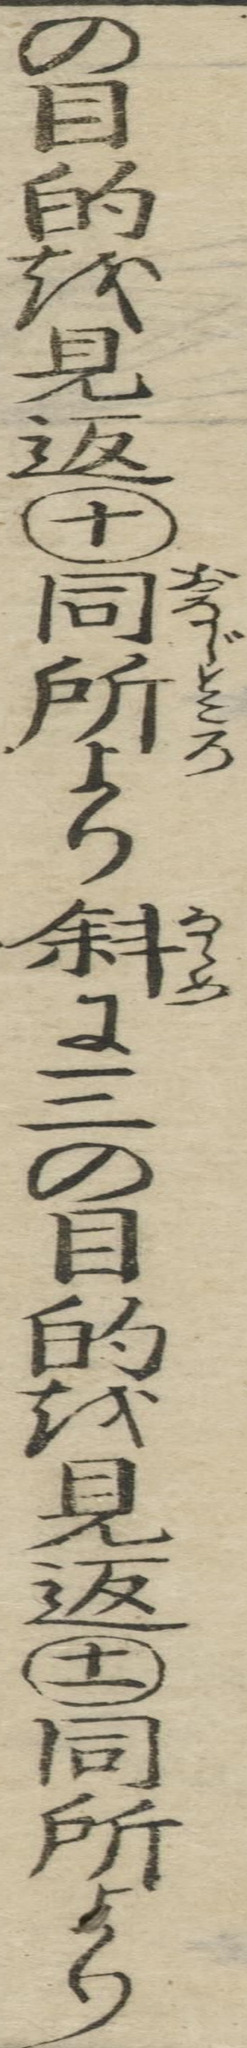の目的を見返㊉同所より斜に三の目的を見返十一同所より
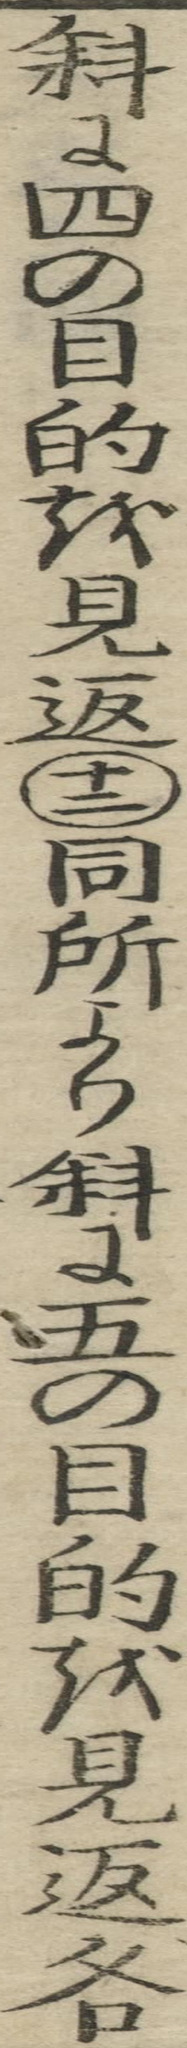斜に四の目的を見返十二同所より斜に五の目的を見返。各

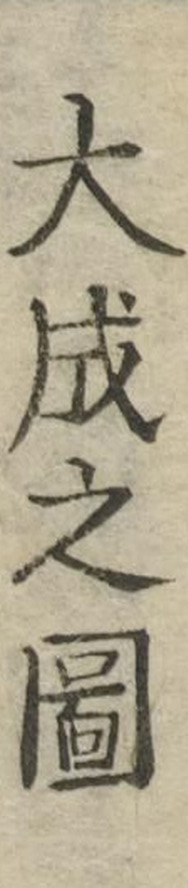大成之図
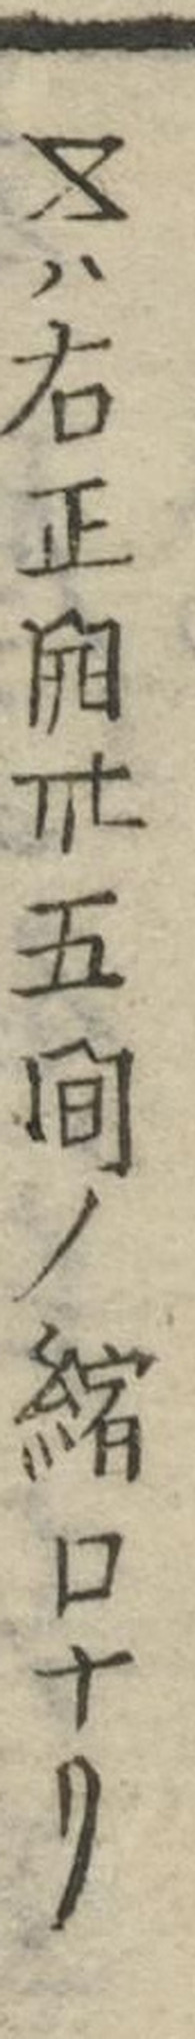▽△ハ右正開丗五間ノ縮口ナリ
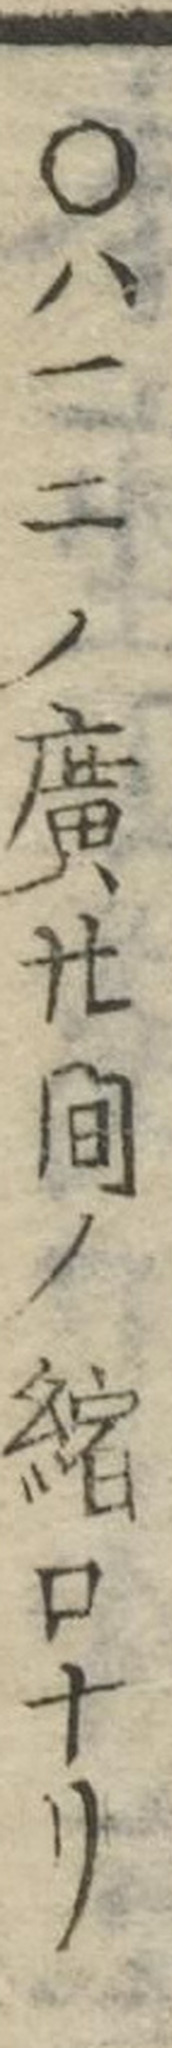○ハ一二ノ広廿間ノ縮口ナリ
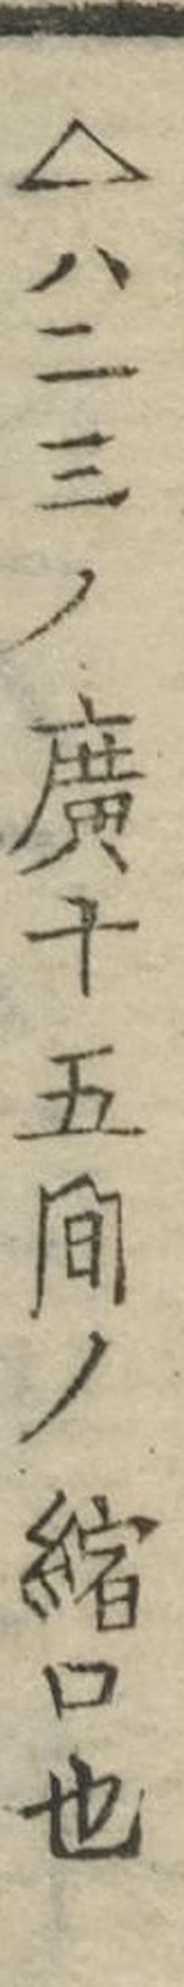△ハ二三ノ広十五間ノ縮口也
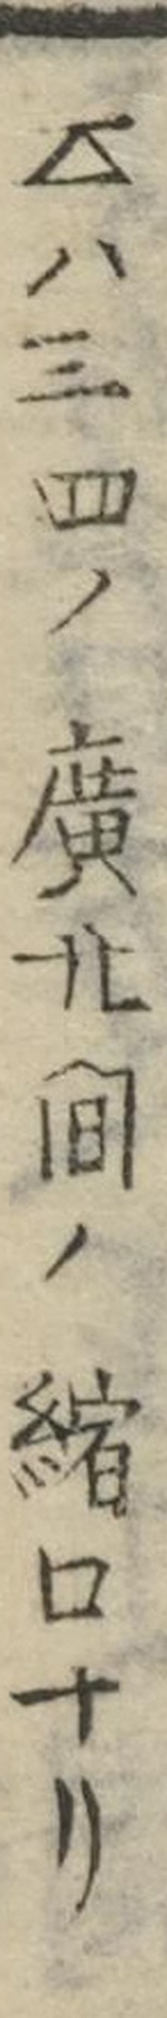△ハ三四ノ広廿間ノ縮口ナリ
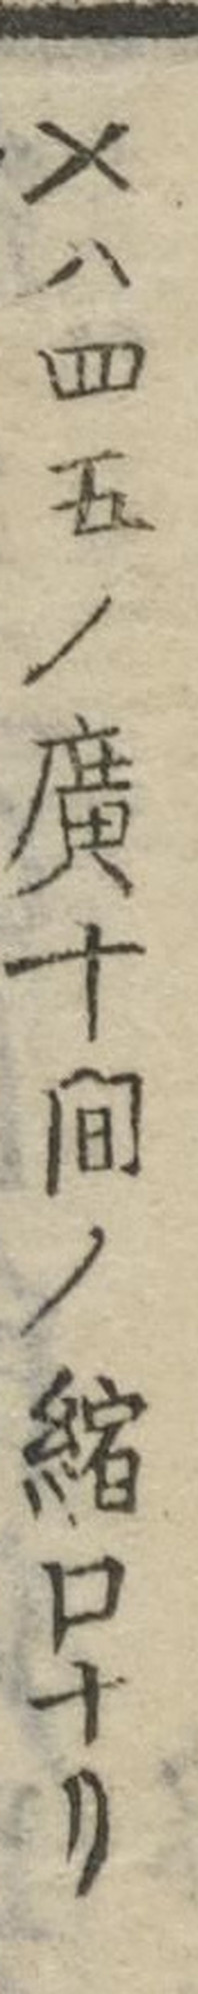✕ハ四五ノ広十間ノ縮口ナリ
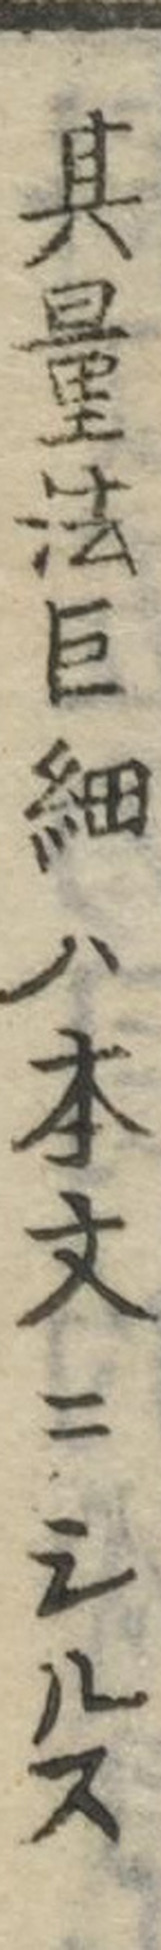其量法巨細ハ本文ニシルス
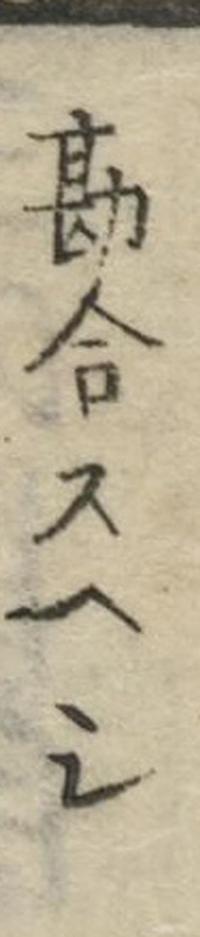勘合スヘシ

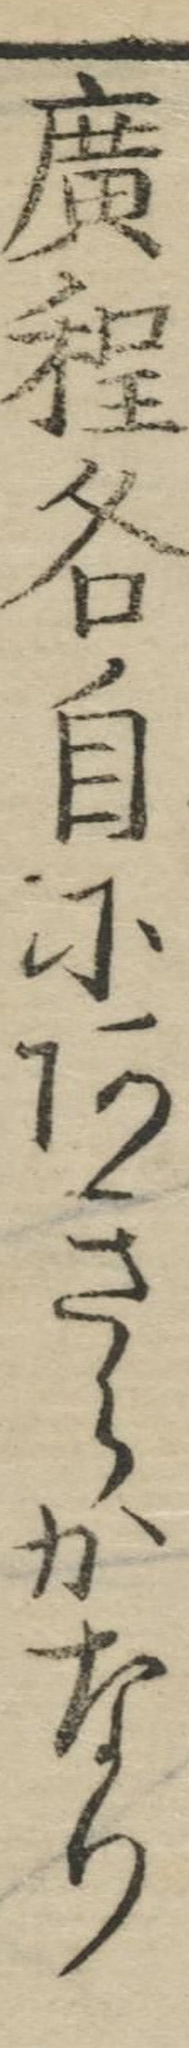広程各自にあきらかなり
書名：量地指南　巻之三（内題）
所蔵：東京大学地震研究所図書室 Earthquake Research Institute Library, The University of Tokyo, JAPAN
